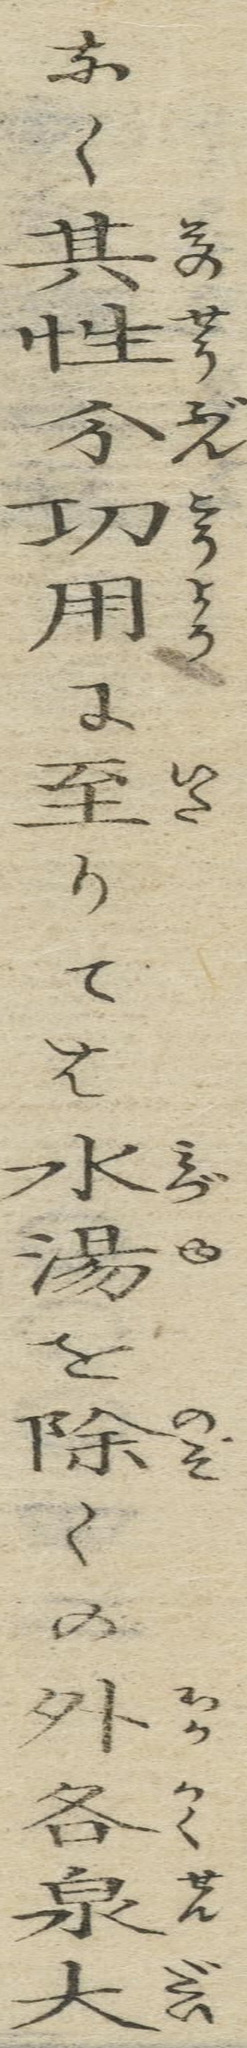なく其性分功用に至りては水湯を除くの外各泉大
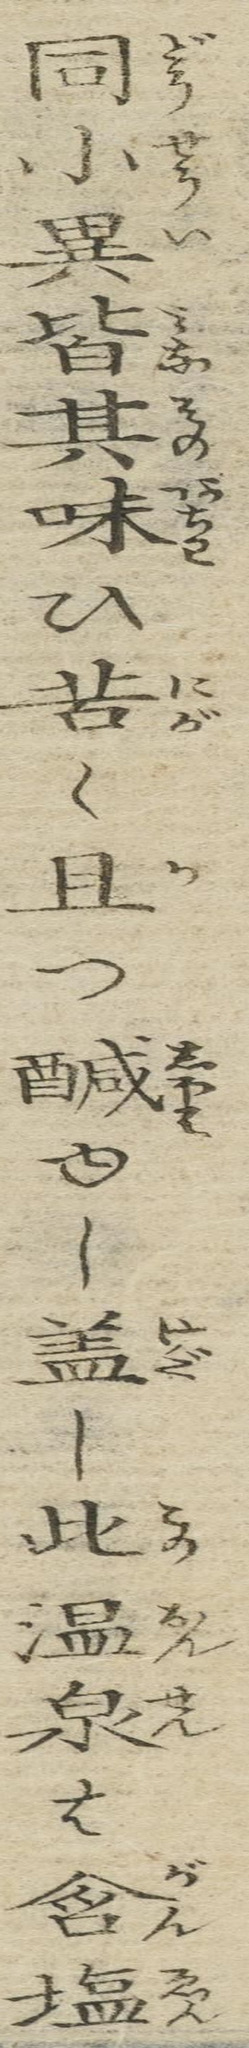同小異皆其味ひ苦し且つ醎ゆし蓋し此温泉は含塩
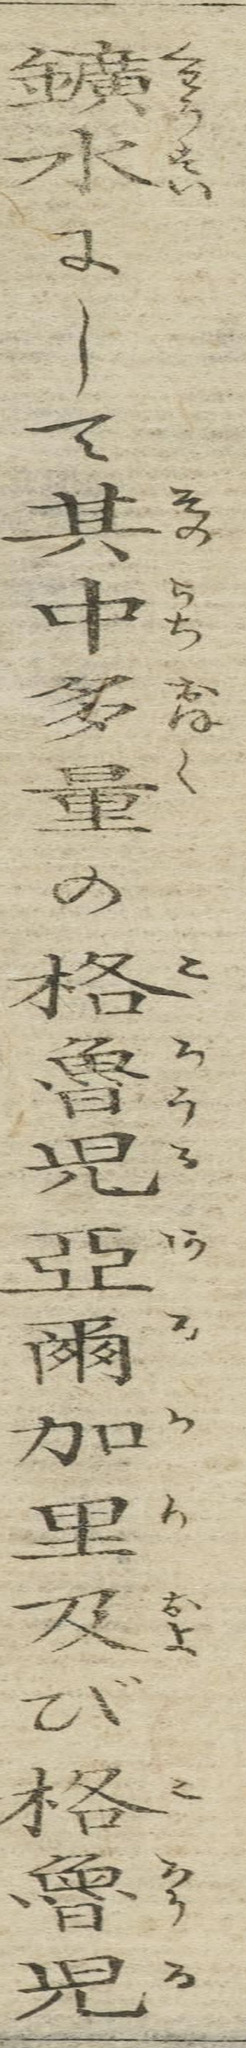鉱水にして其中多量の格魯児亜爾加里及び格魯児
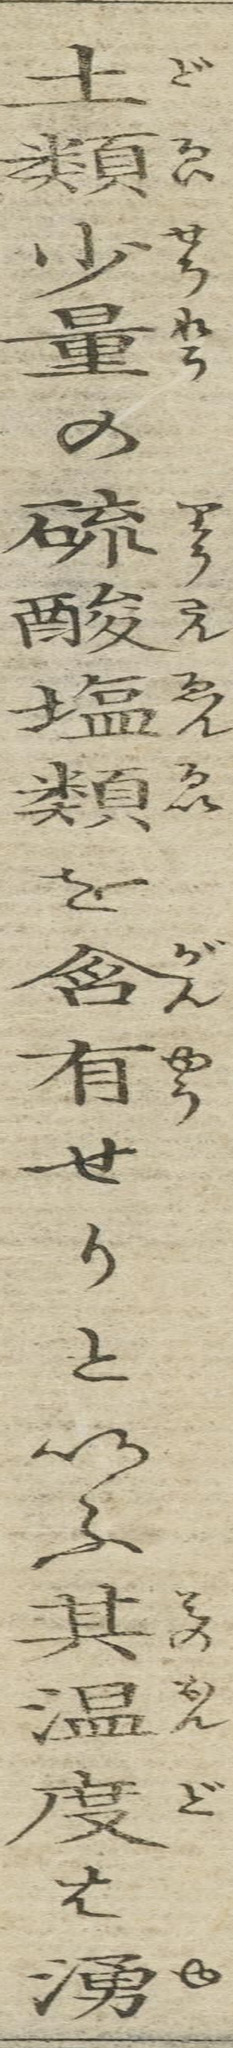土類少量の硫酸塩類を含有せりといふ其温度は湧
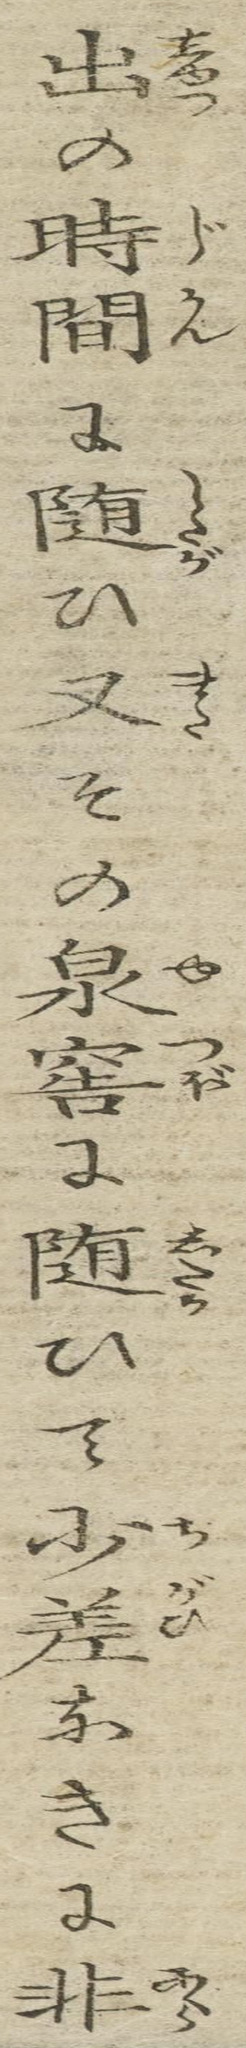出の時間に随ひ又その泉窖に随ひて少差なきに非
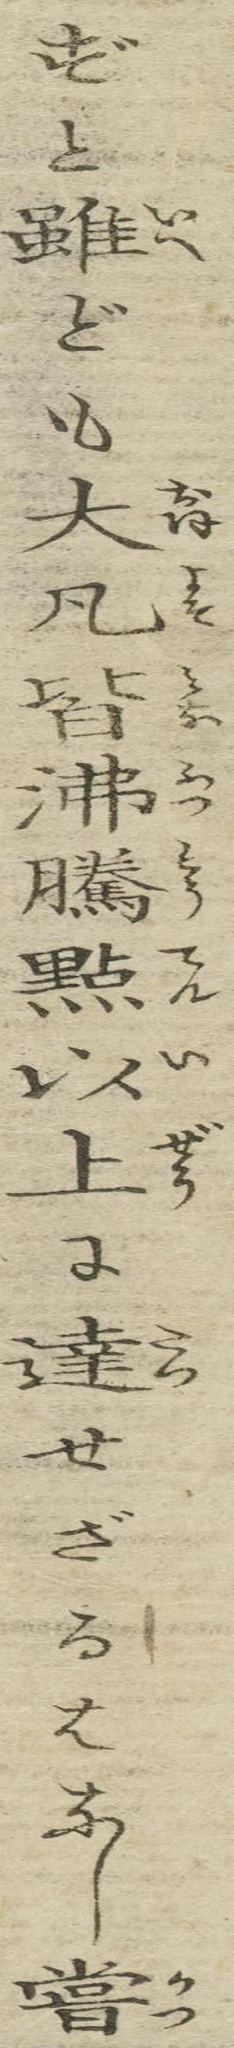ずと雖ども大凡皆沸騰点以上に達せざるはなし嘗
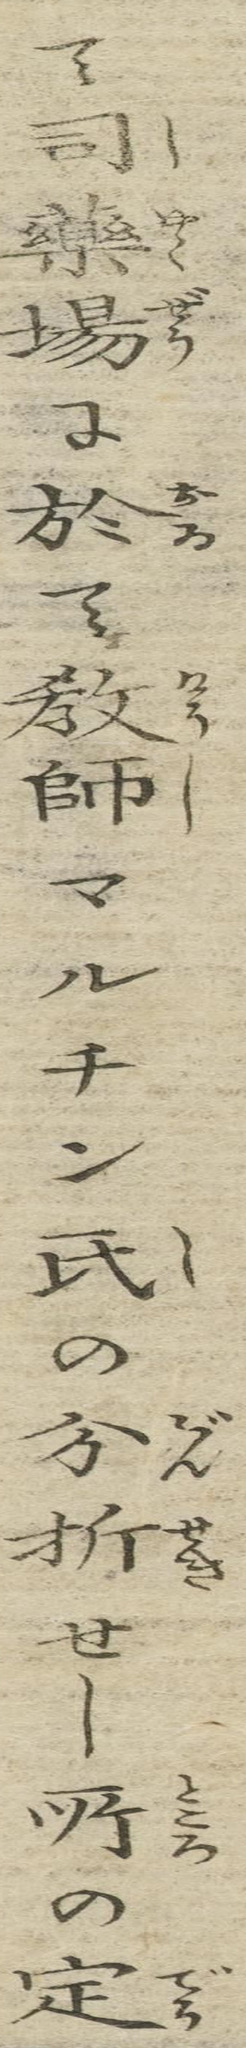て司薬場に於て教師マルチン氏の分析せし所の定
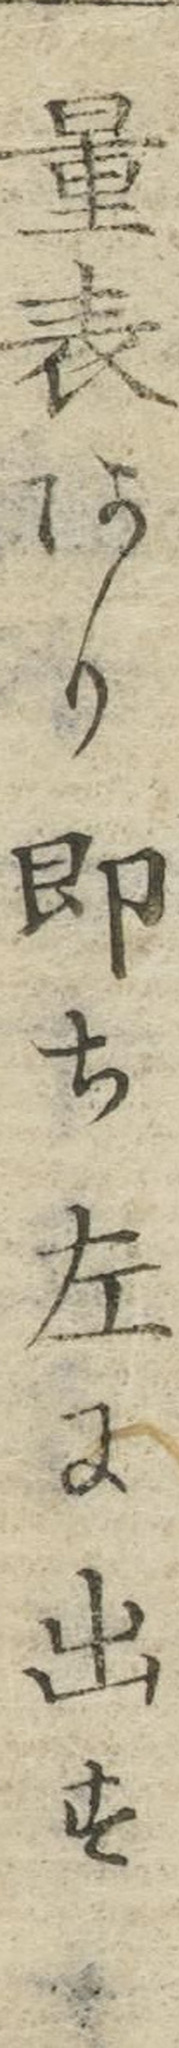量表あり即ち左に出す

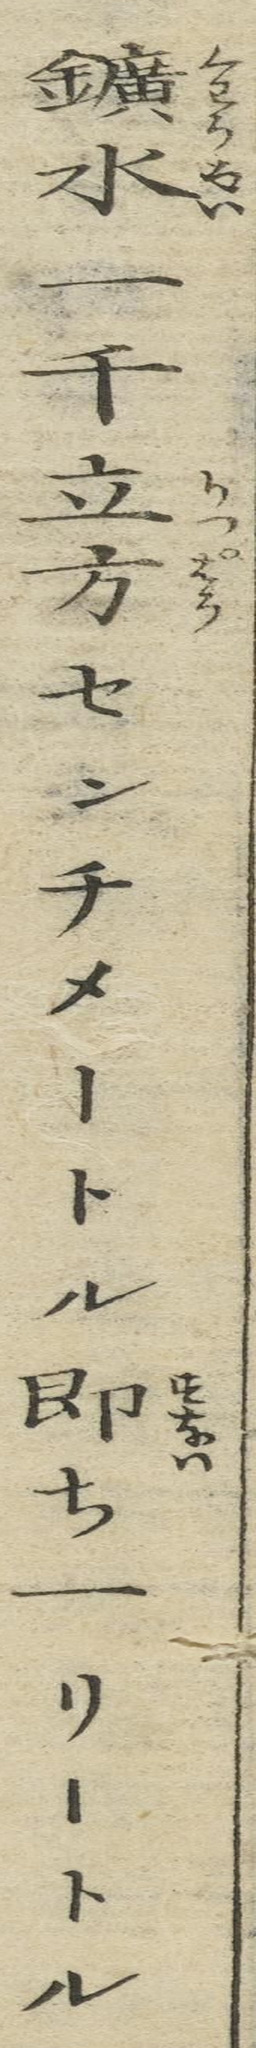鉱水一千立方センチメートル即ち一リートル
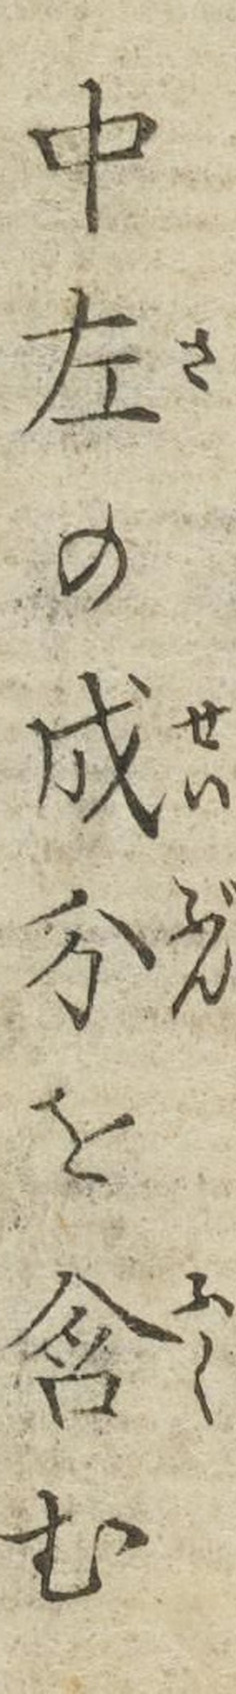中左の成分を含む
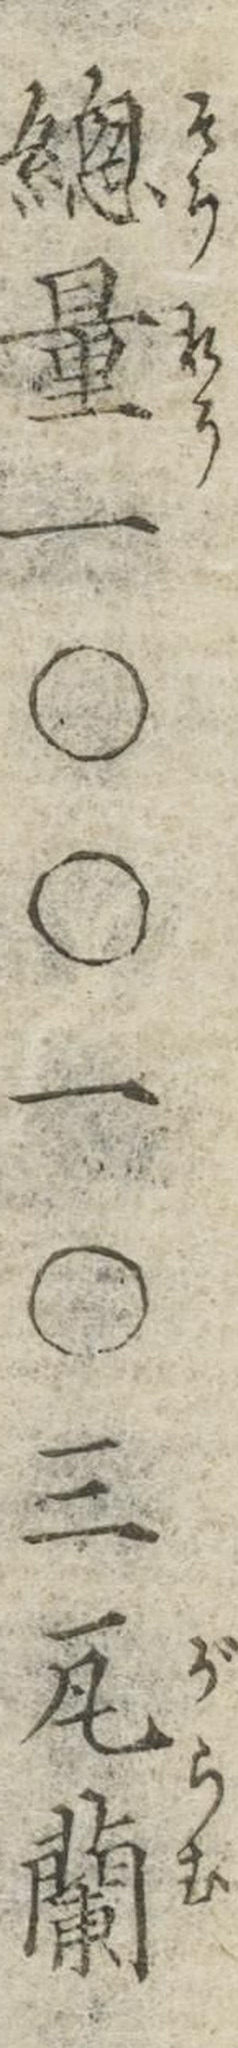総量一〇〇一〇三瓦蘭
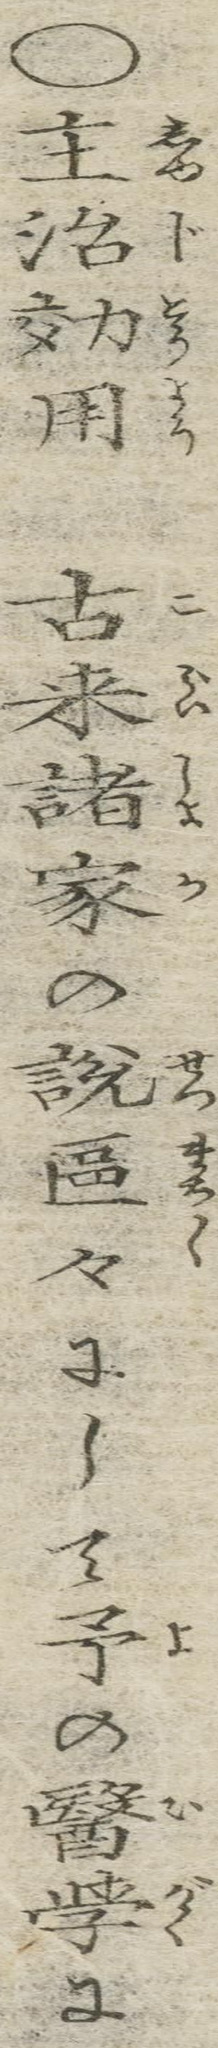○主治効用古来諸家の説区々にして予の医学に
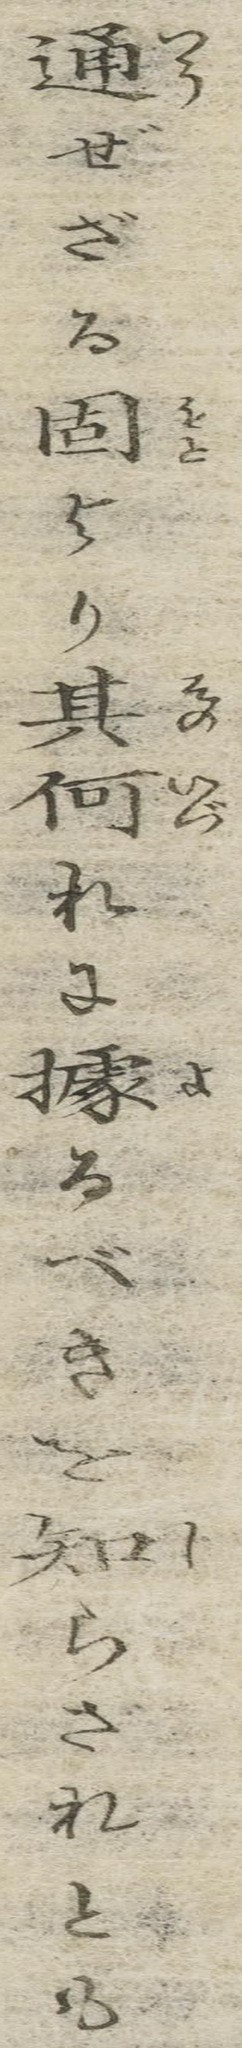通ぜざる固より其何れに拠るべきを知られとも
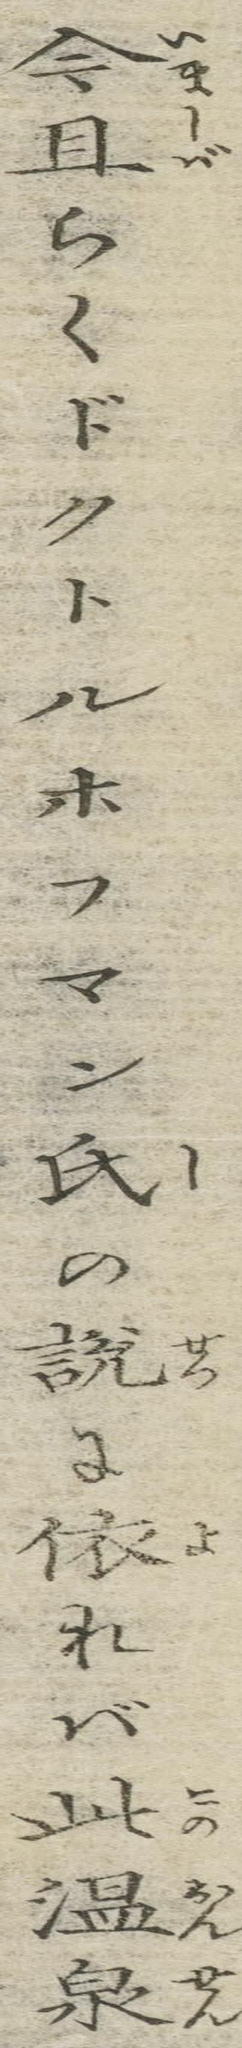今且らくドクトルホフマン氏の説に依れば此温泉
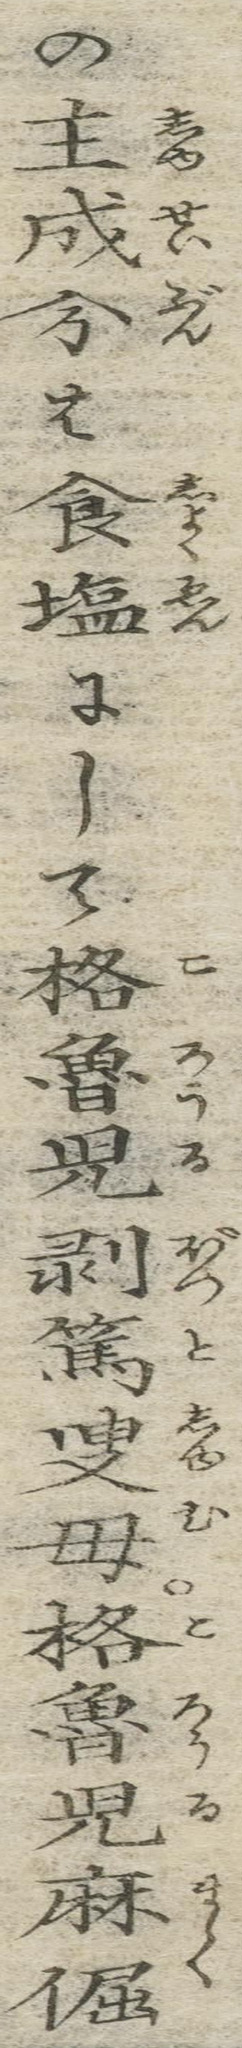の主成分を食塩にして格魯児剥篤叟母。格魯児麻倔
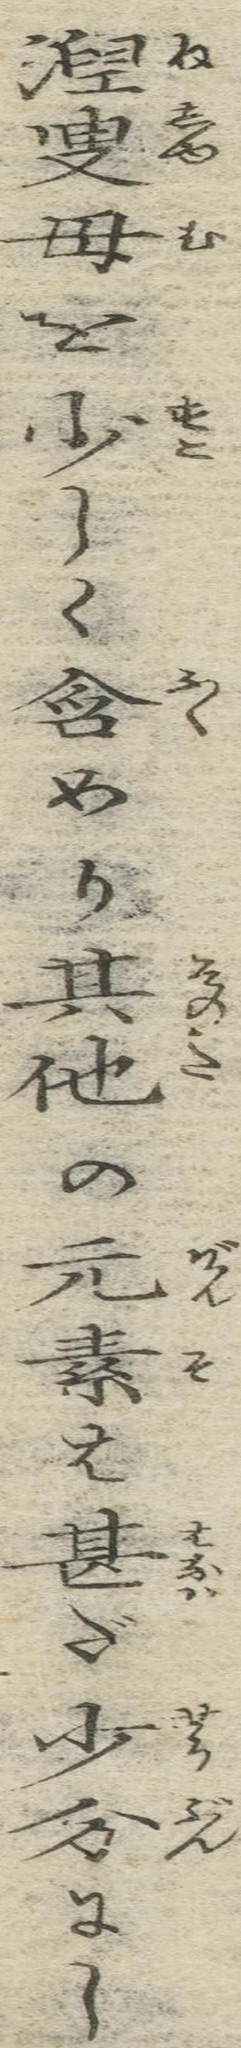涅叟母を少しく含めり其他の元素は甚だ少分にし
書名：豆州熱海誌　完
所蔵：東京大学地震研究所図書室 Earthquake Research Institute Library, The University of Tokyo, JAPAN
